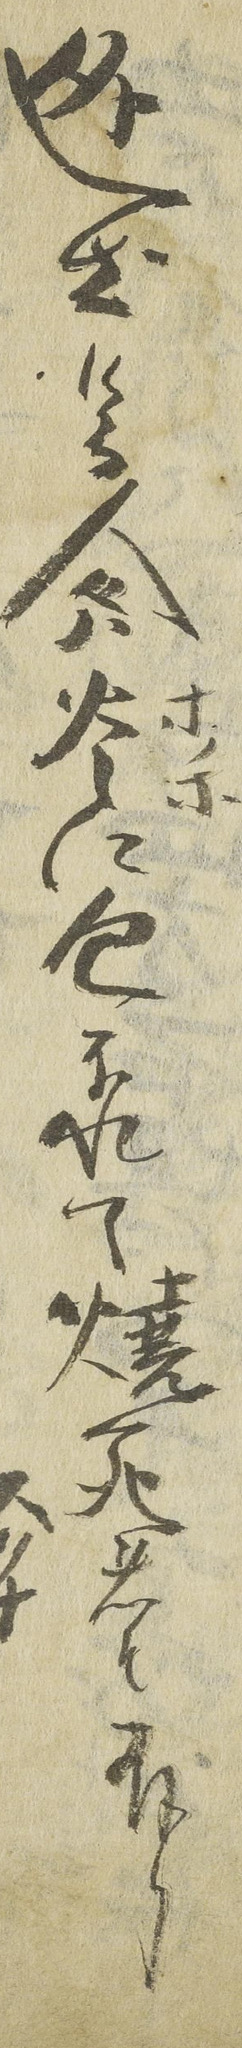逃出ける人々は炎に包まれて焼死者も有り
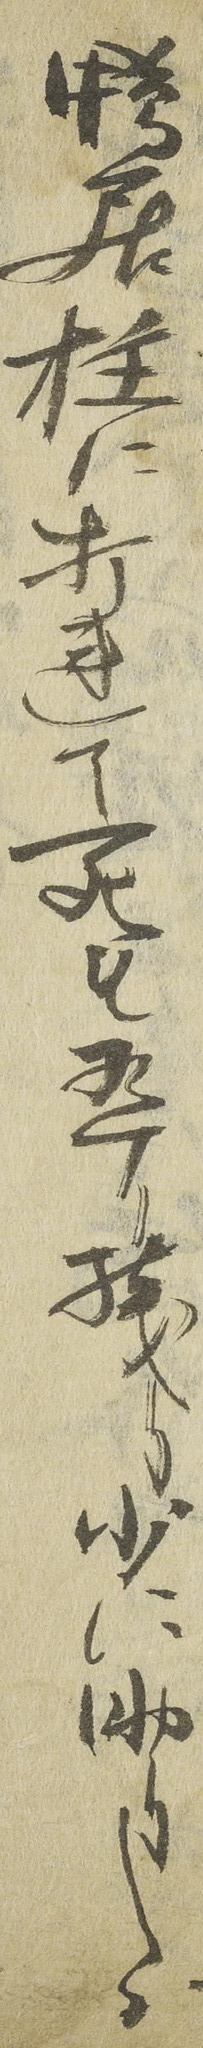鴨居柱に打れて死も有り残り少に助りし分
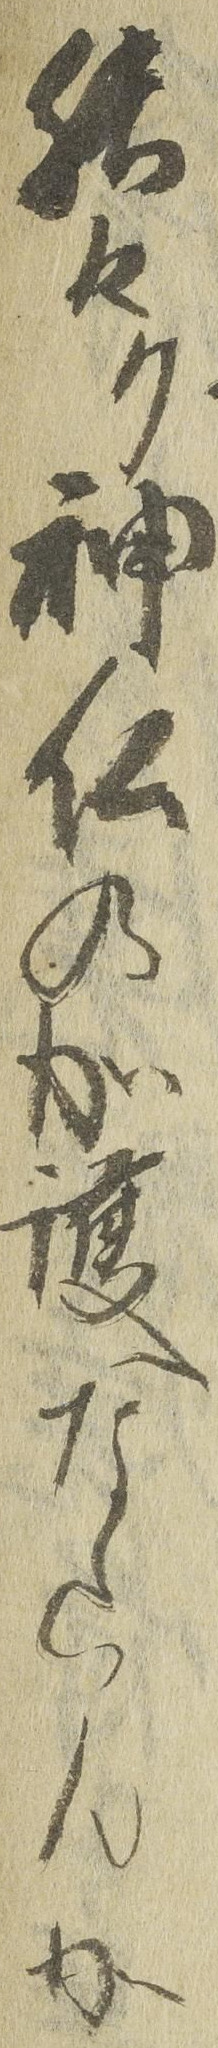能々ク神仏の加護ならんか

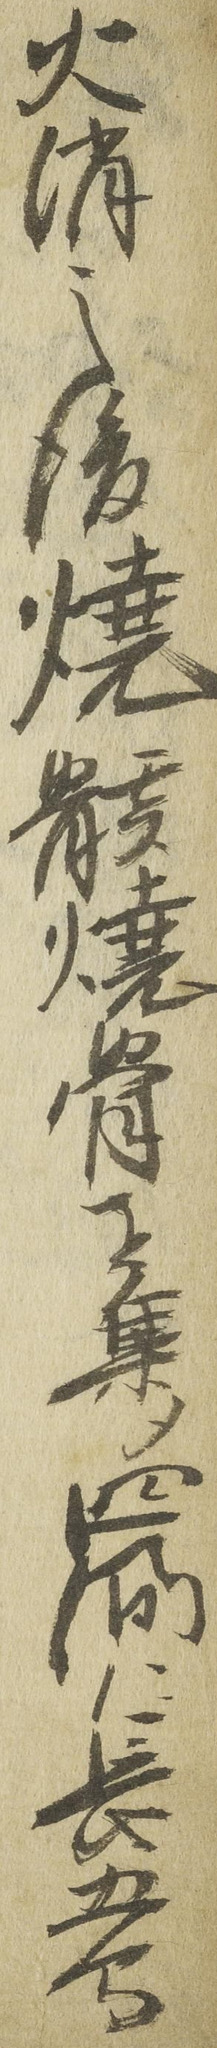火消之後焼骸焼骨を集メ四間に長五間
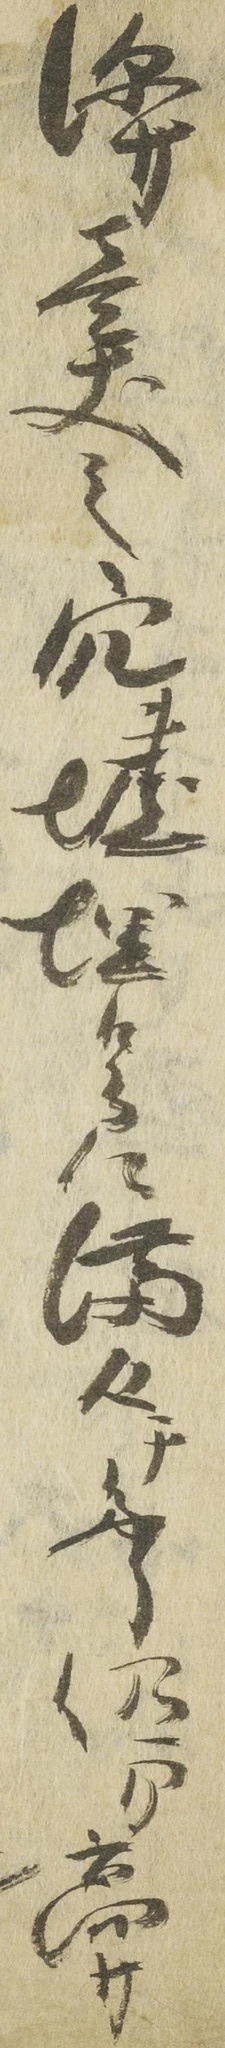深サ壱丈之穴ヲ堀埋けるに満々トたり仍而高サ
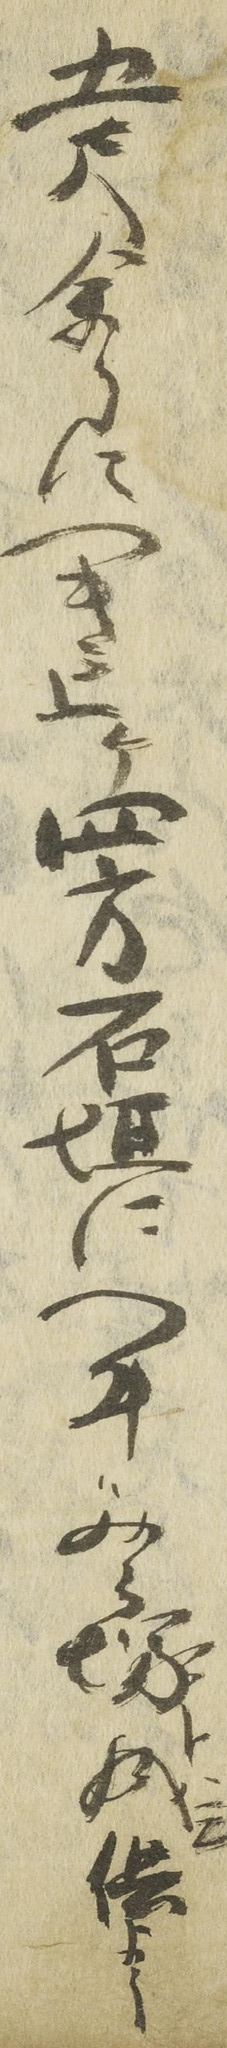五尺余りにつき上ケ四方石垣につみ祭塚ト成シ供よう
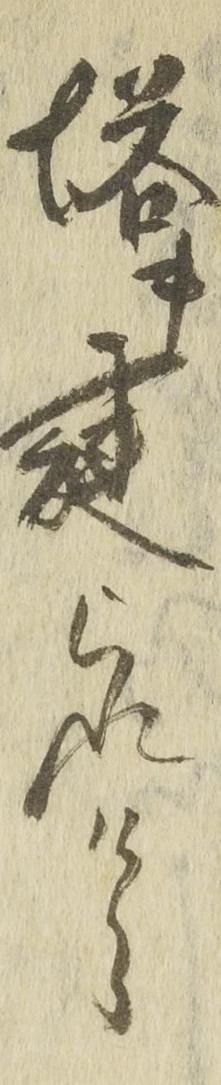塔ヲ建られける
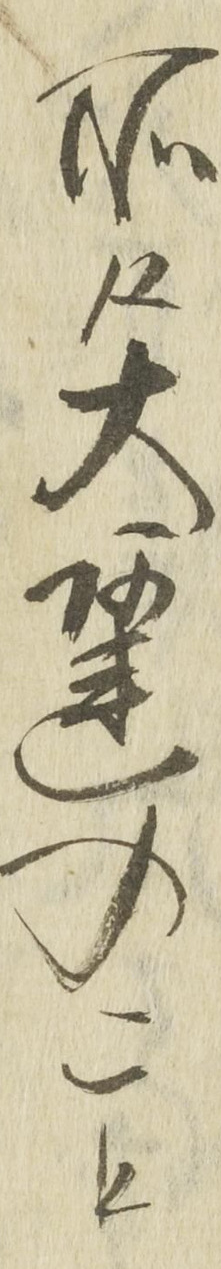所々大あれのこと
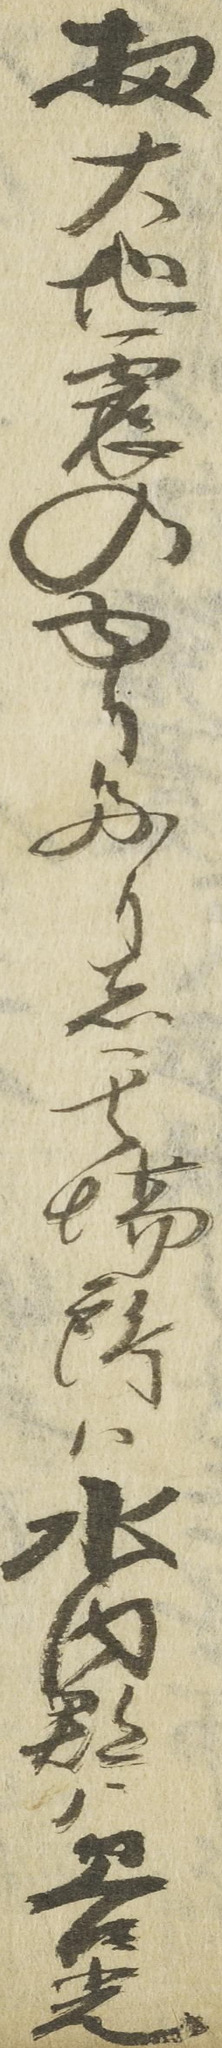扨大地震のゆりたりし其場所ハ水内郡ハ善光
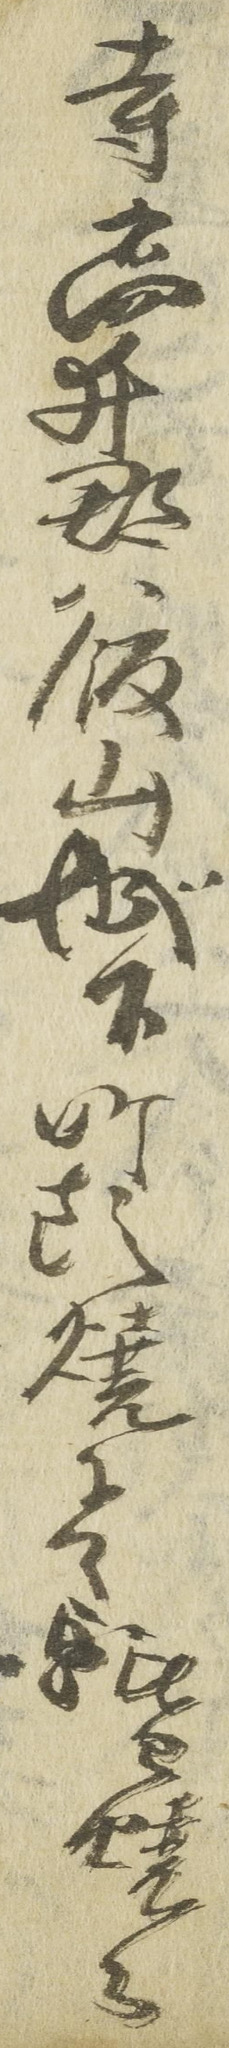寺高井郡ハ飯山城下町類焼にて皆焼而
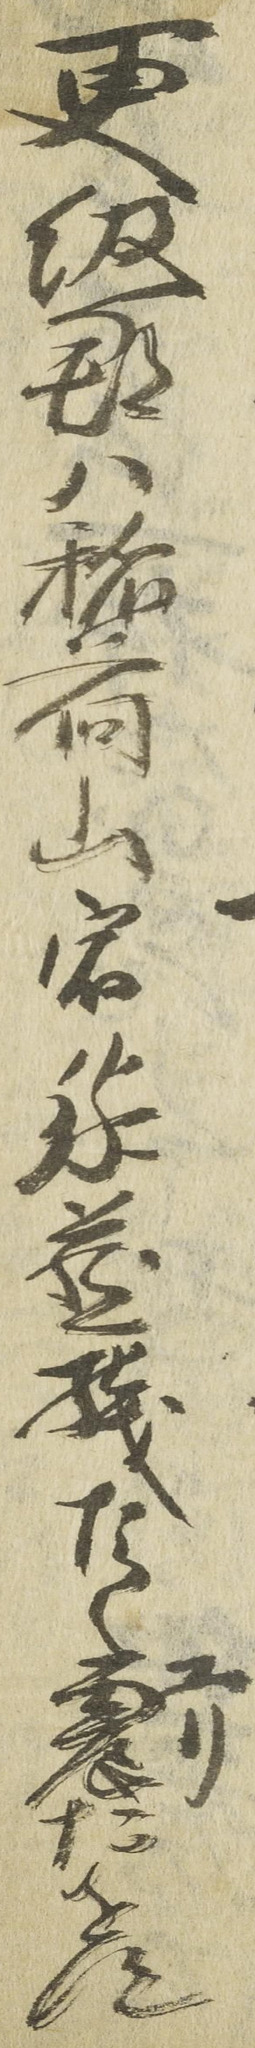更級郡ハ稲荷山宿家蔵残なく震たをす
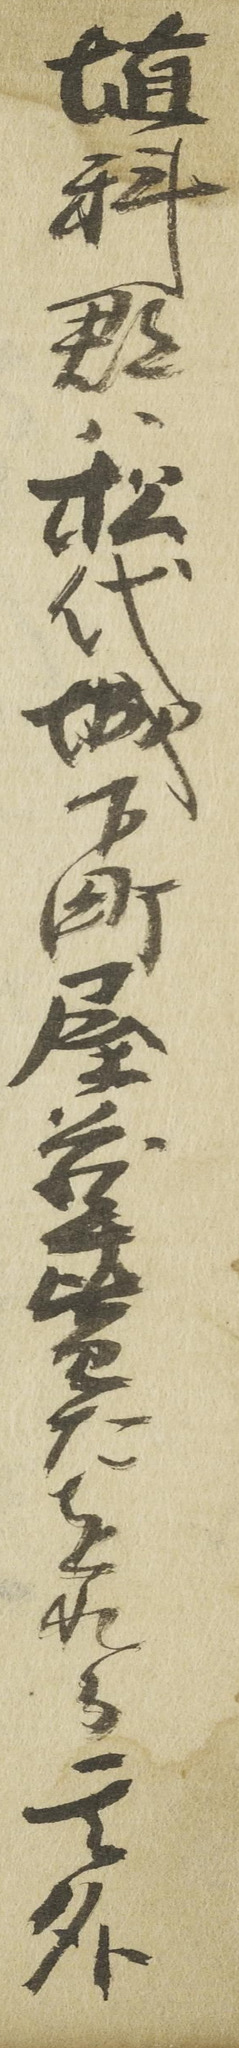埴科郡ハ松代城下町屋蔵皆たをれる其外
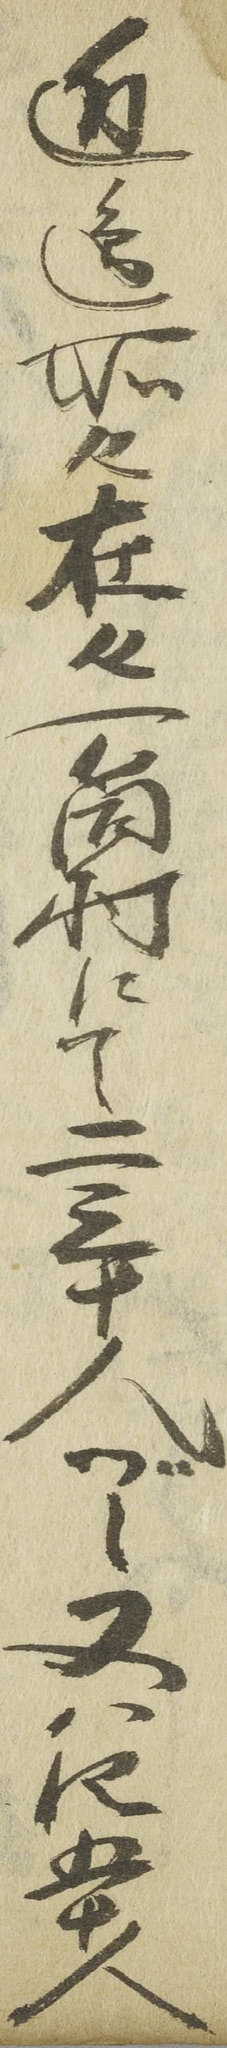近辺所々在々一箇所にて二三十人ヅヽ又ハ四五十人
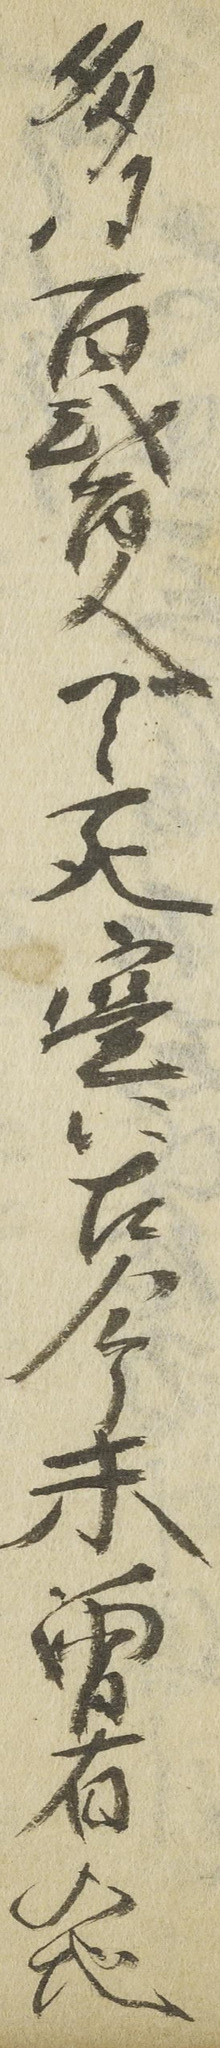多クハ百弐百人ヅヽ死寔に古今未曾有の地
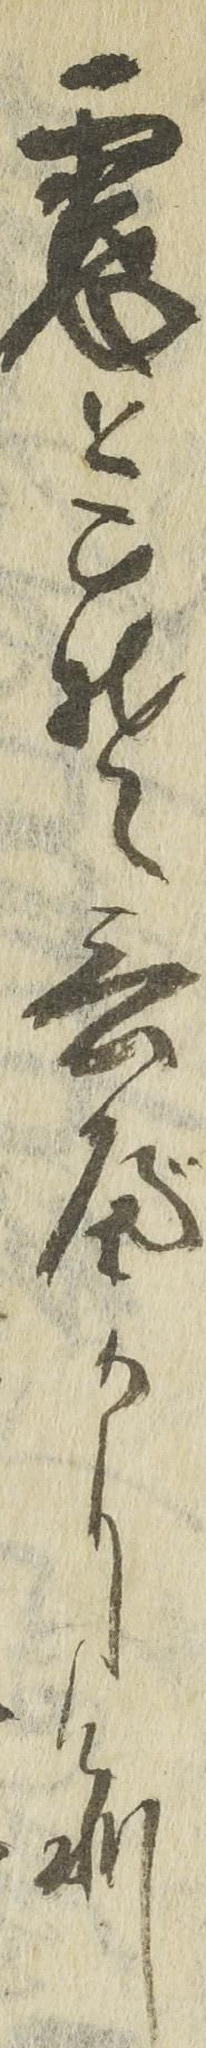震とこそ言べかりけり
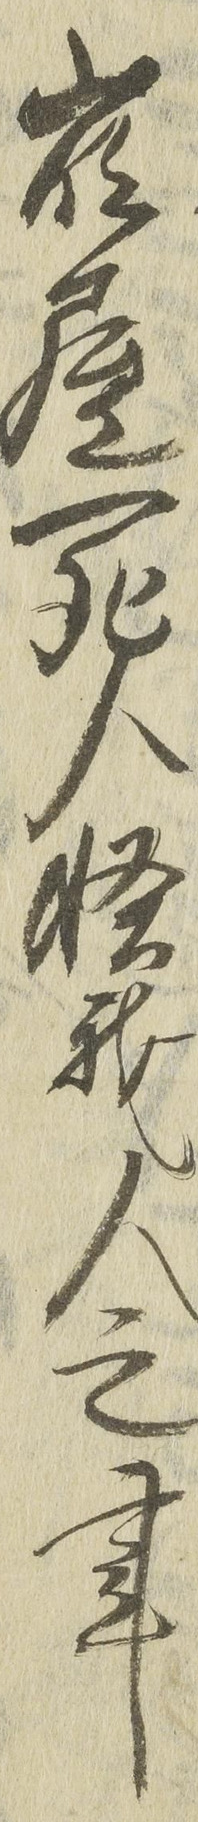崩屋死人怪我人之事
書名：善光寺地震聞書
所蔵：東京大学地震研究所図書室 Earthquake Research Institute Library, The University of Tokyo, JAPAN
